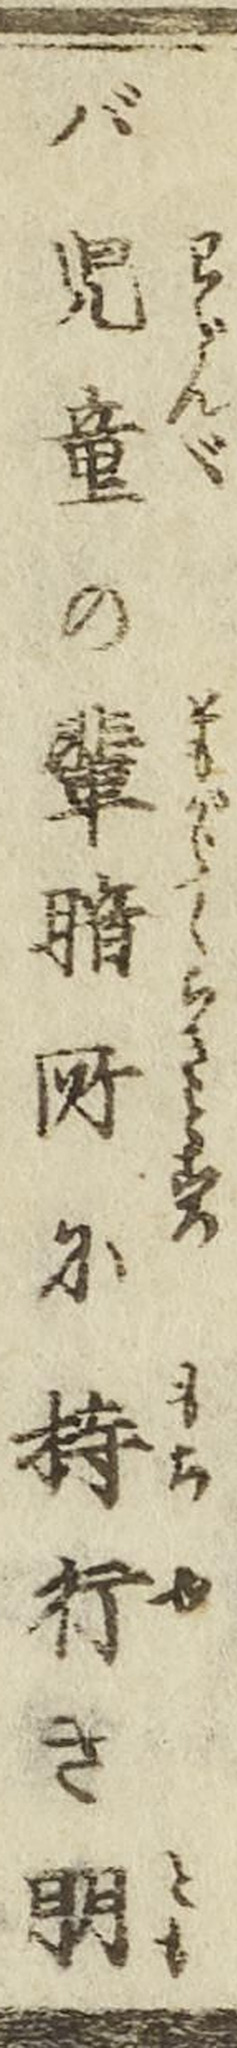ば児童の輩暗所に持行き朋
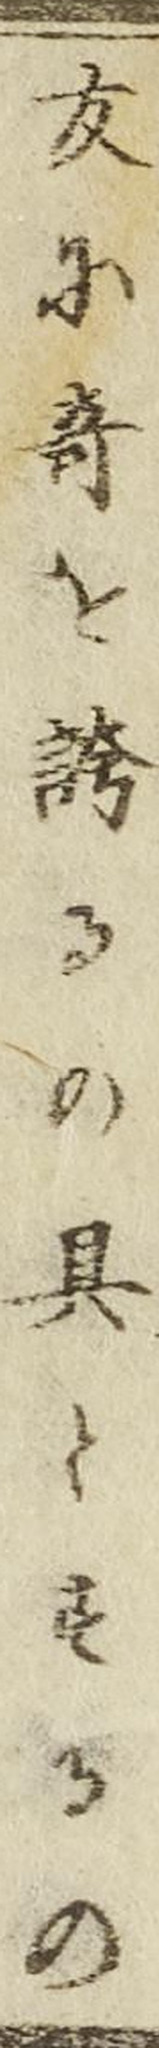友に奇を誇るの具とするの
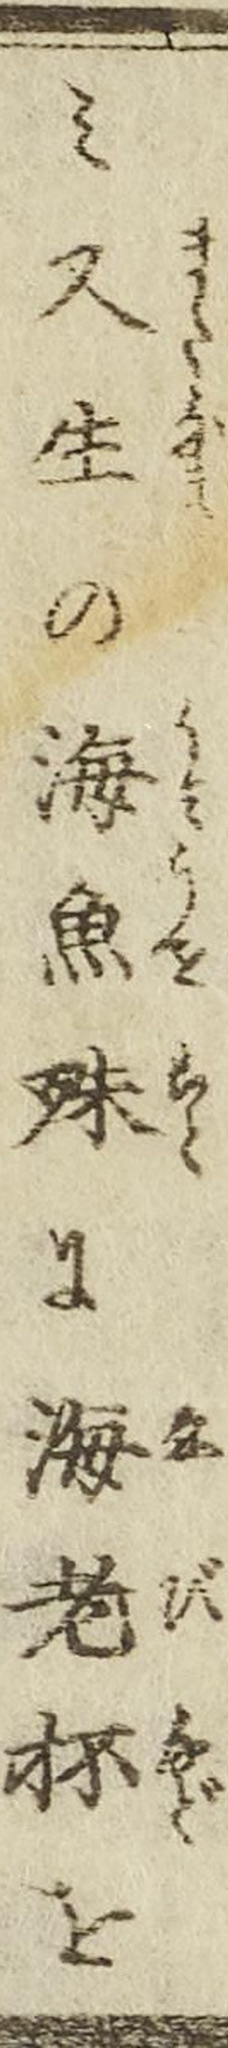み又生の海魚殊に海老抔を
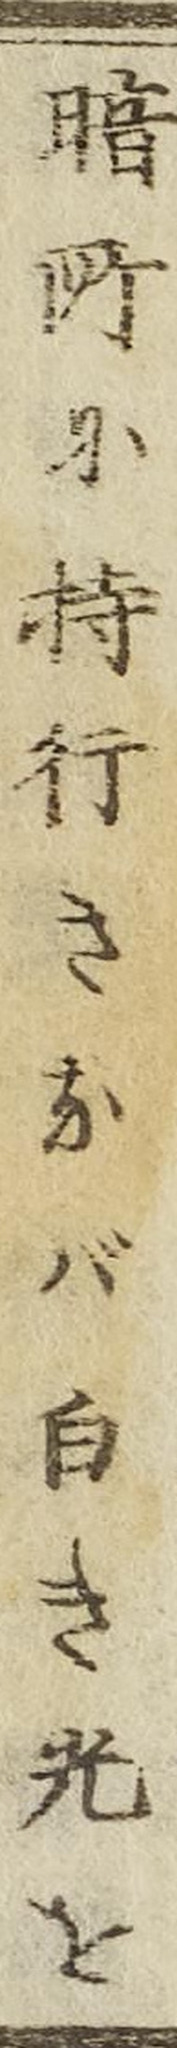暗所に持行きなば白き光を

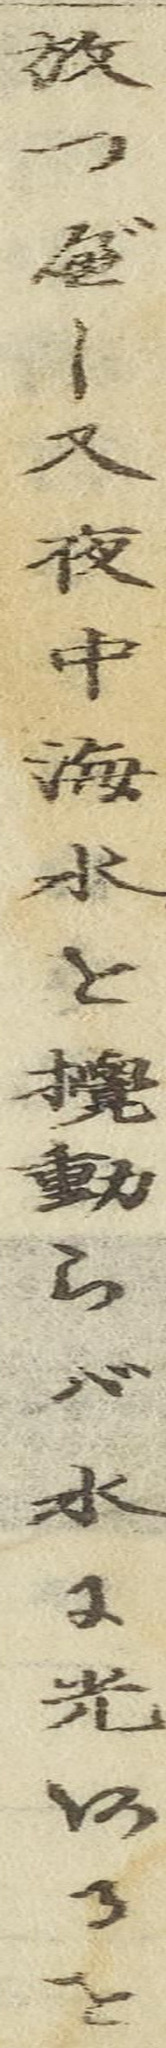放つべし又夜中海水を攪動らば水に光あるを
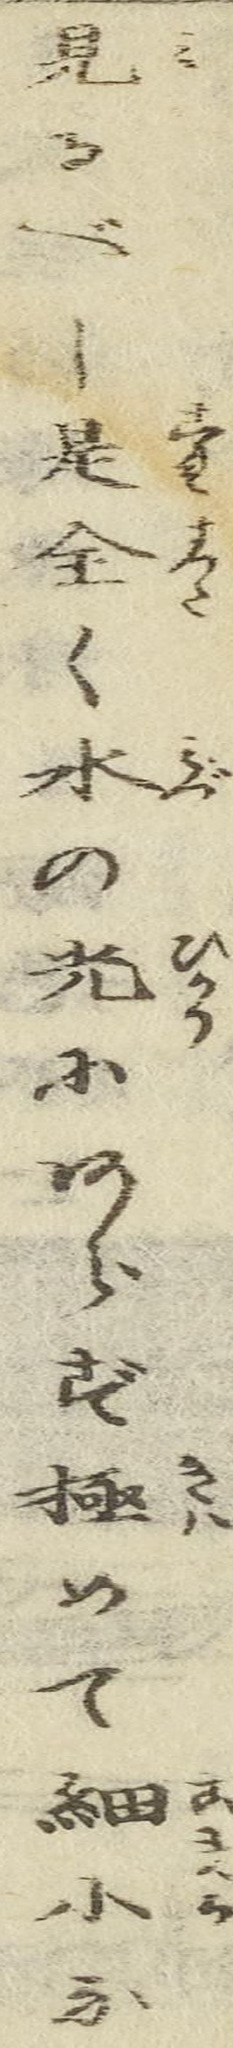見るべし是全く水の光にあらず極めて細小な
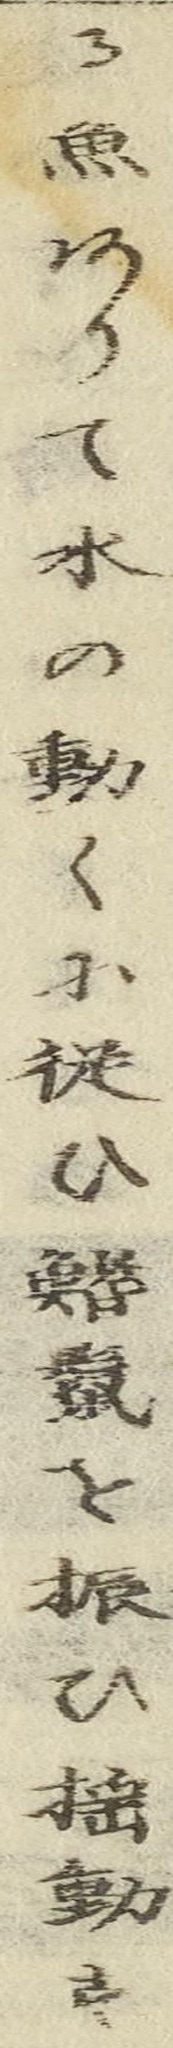る魚ありて水の動くに従ひ鰭鬛を振ひ揺動す
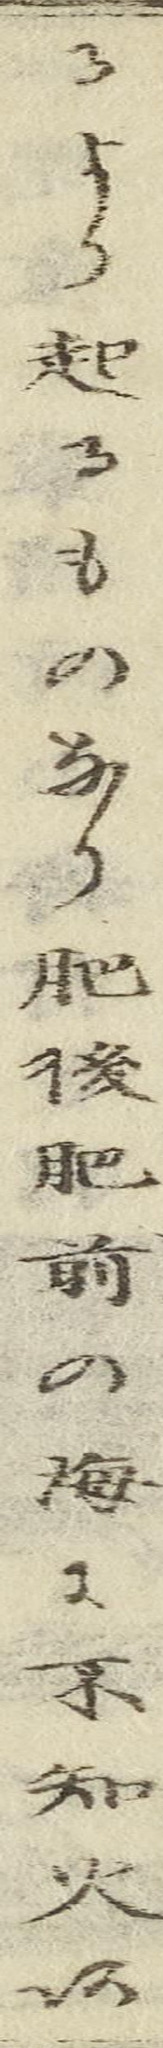るより起るものなり肥後肥前の海に不知火あ
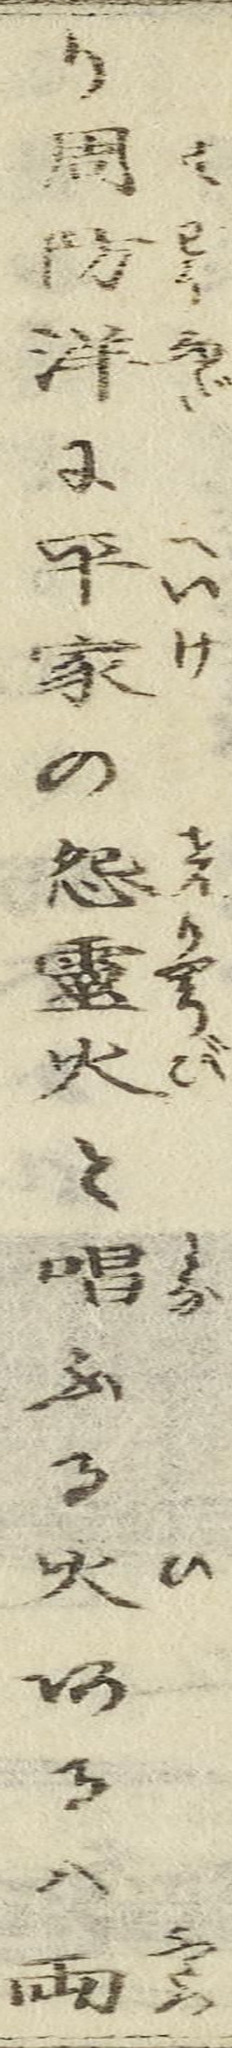り周防洋に平家の怨霊火と唱ふる火あるは両
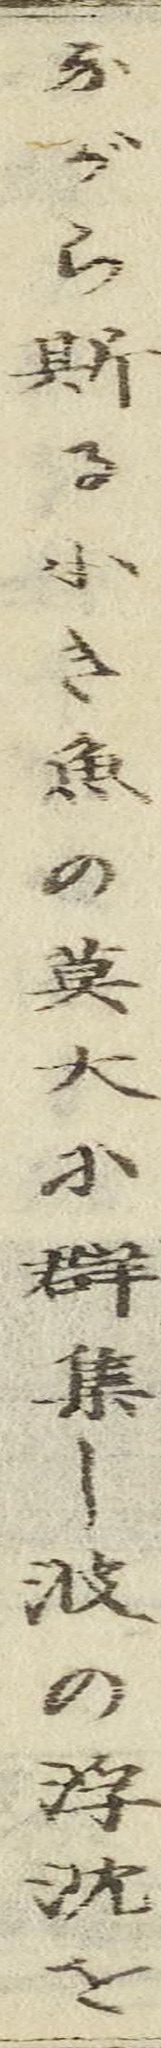ながら斯る小き魚の莫大に群衆し波の浮沈を
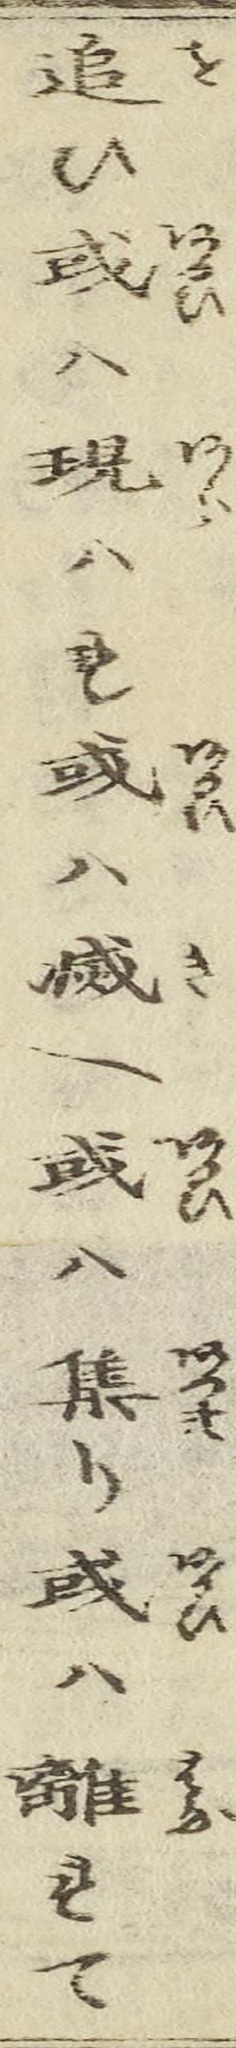追ひ或は現はれ或は滅へ或は集り或は離れて
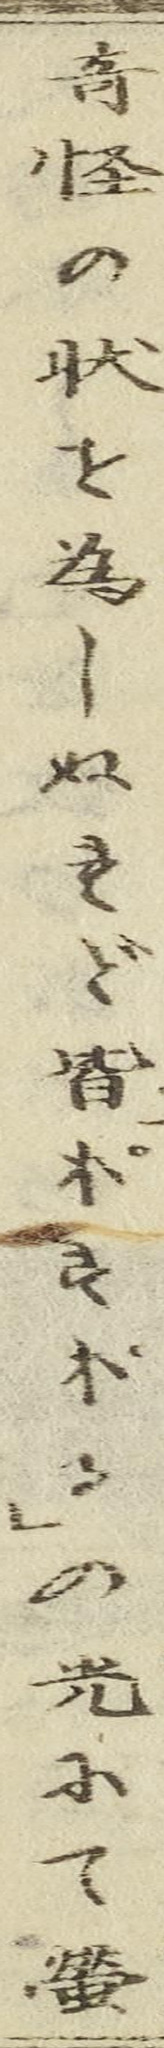奇怪の状を為しぬれど皆「ぽすぽる」の光にて蛍
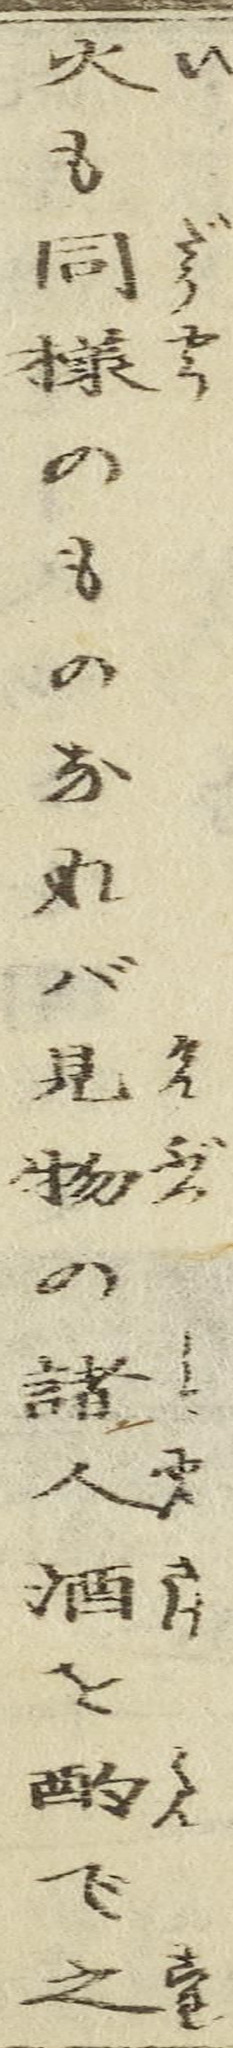火も同様のものなれば見物の諸人酒を酌で之
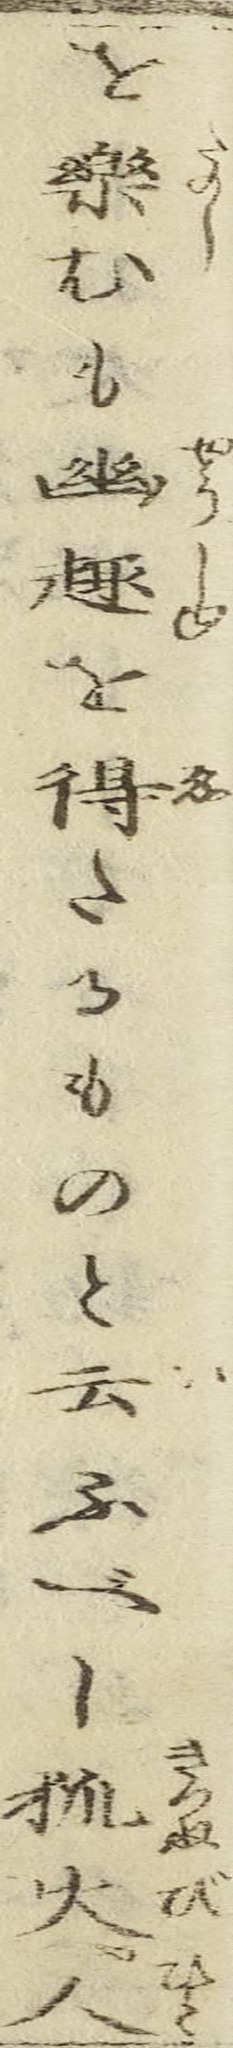を楽むも幽趣を得たるものと云ふべし狐火人
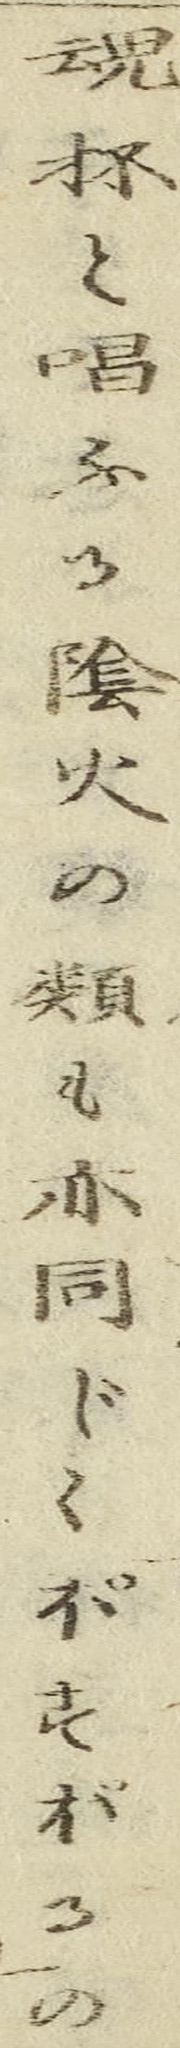魂抔と唱ふる陰火の類も亦同じく「ぽすぽる」の
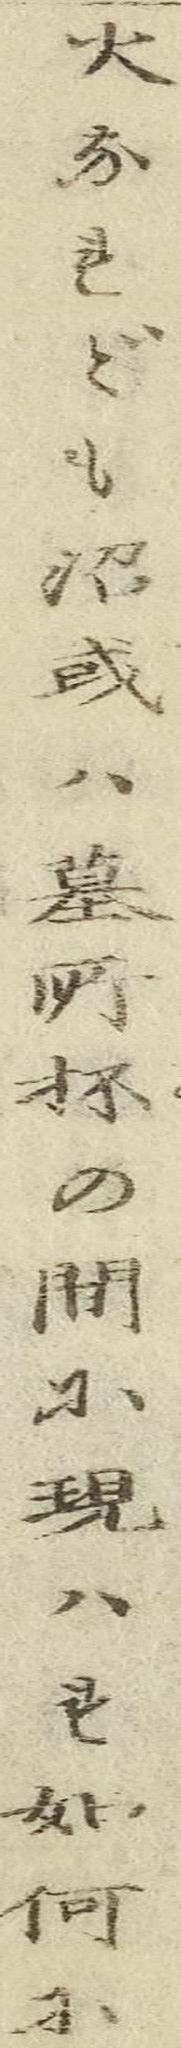火なれども沼或は墓所抔の間に現はれ如何に
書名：天変地異
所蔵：東京大学地震研究所図書室 Earthquake Research Institute Library, The University of Tokyo, JAPAN
